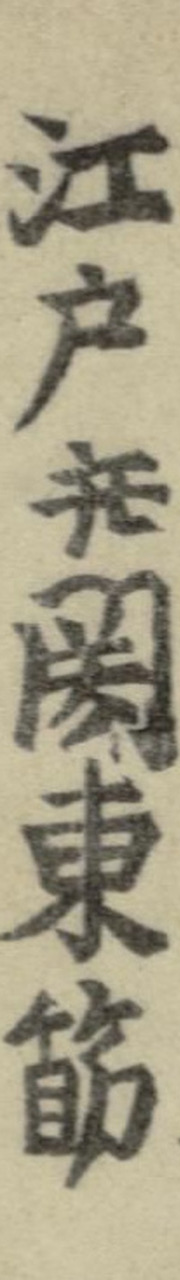江戸并関東筋
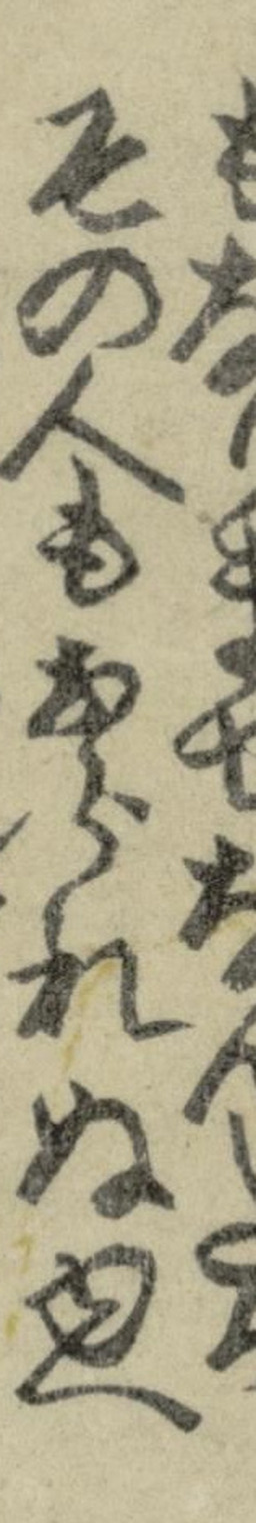その人もおられぬゆへ
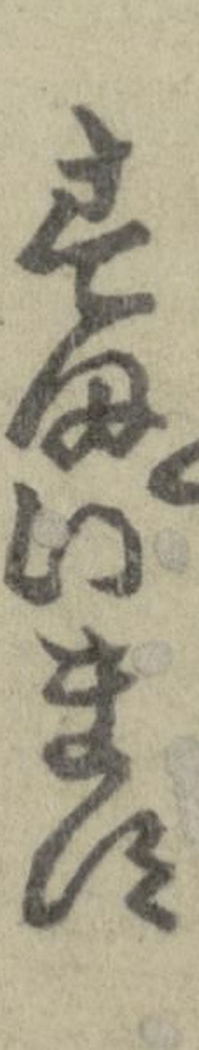すまいます
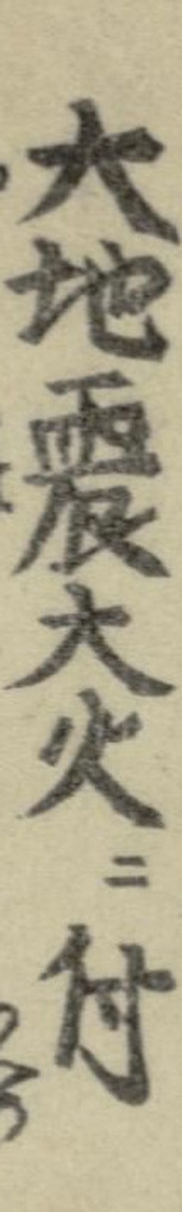大地震大火に付
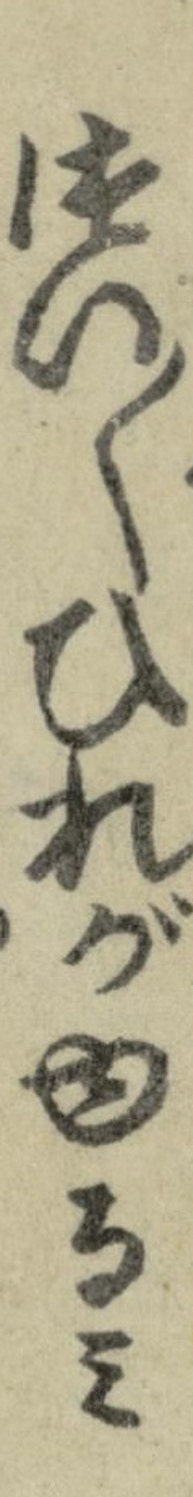つい〳〵ひれがゆるみ
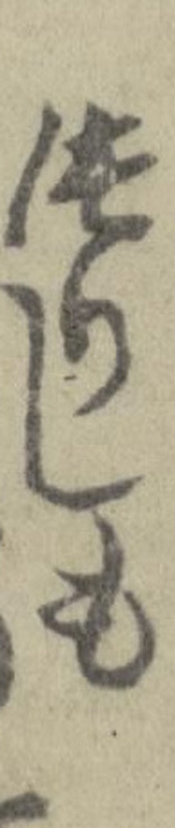つりしも
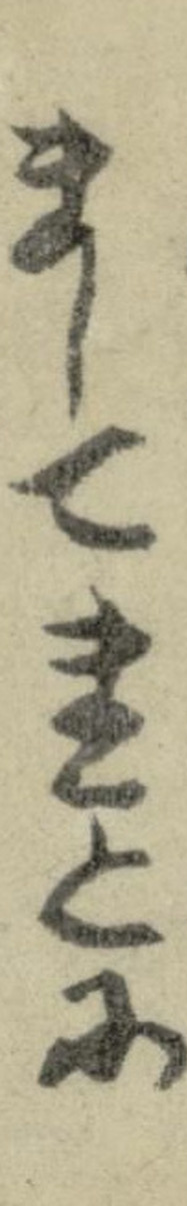ましてまことに
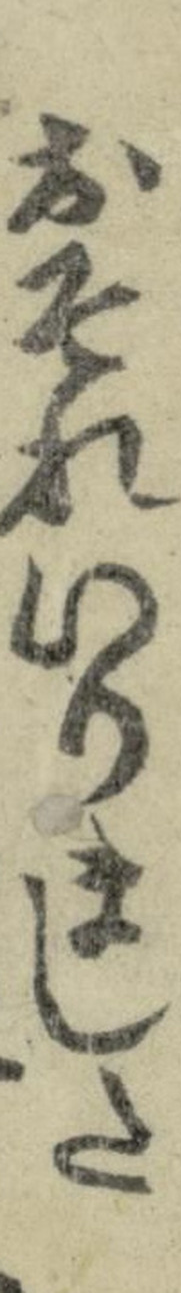おそれいりました
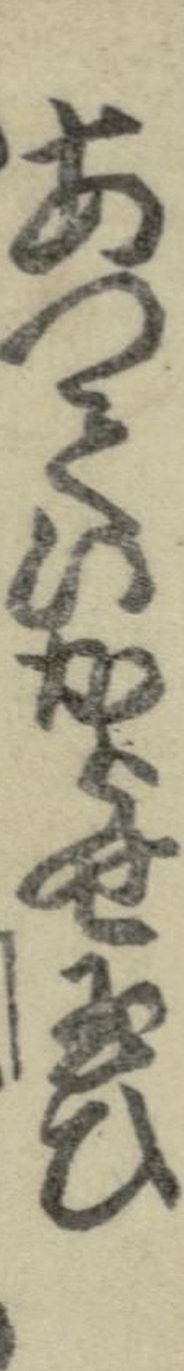あつていからせ玉ひ
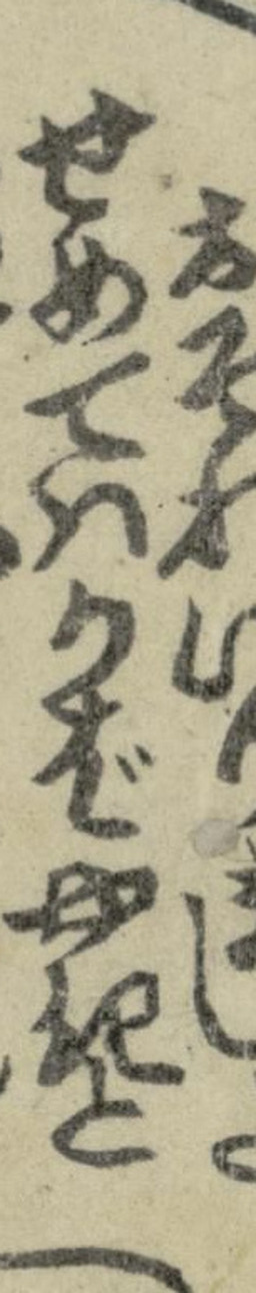せめてはかばやきと
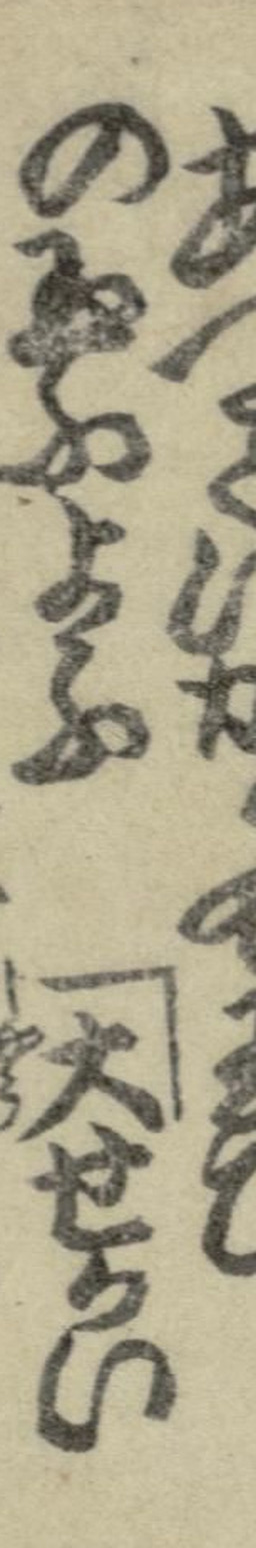の玉ふよふ〽大せかい
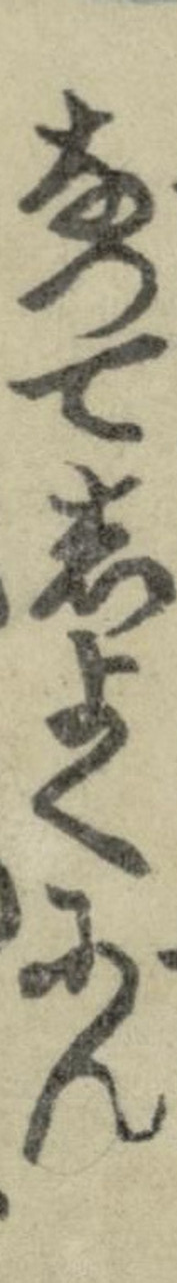なつてしよくにん
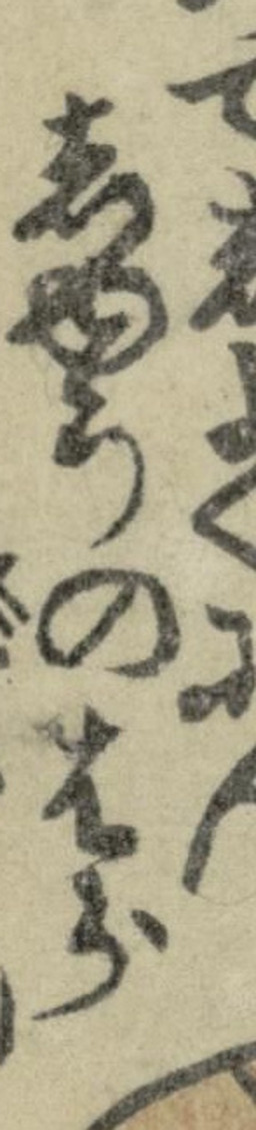しゆうのはら
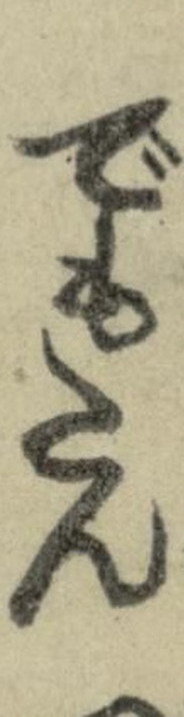でもたん
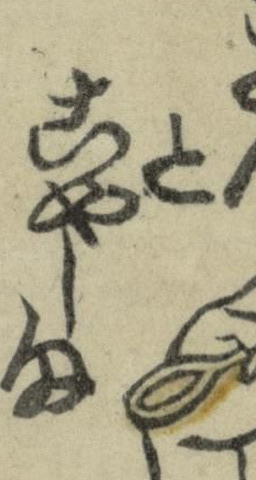こやしま
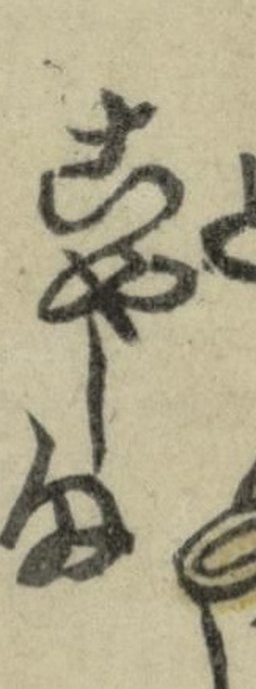こやしま
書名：[すい神のおしえにいのちたすかりて]
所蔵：東京大学地震研究所図書室 Earthquake Research Institute Library, The University of Tokyo, JAPAN
